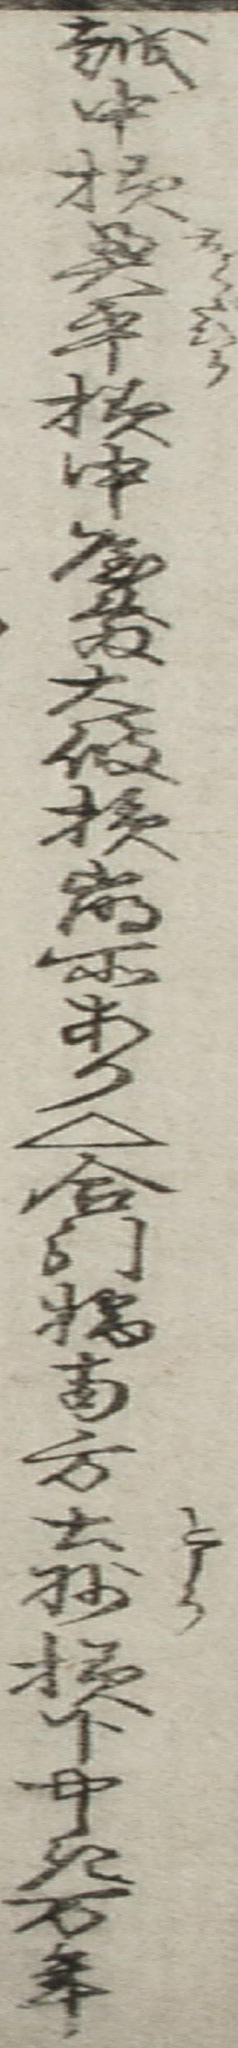越中様奥平様中屋敷大破損崩所あり△合引橋南方土州様下やしき万年
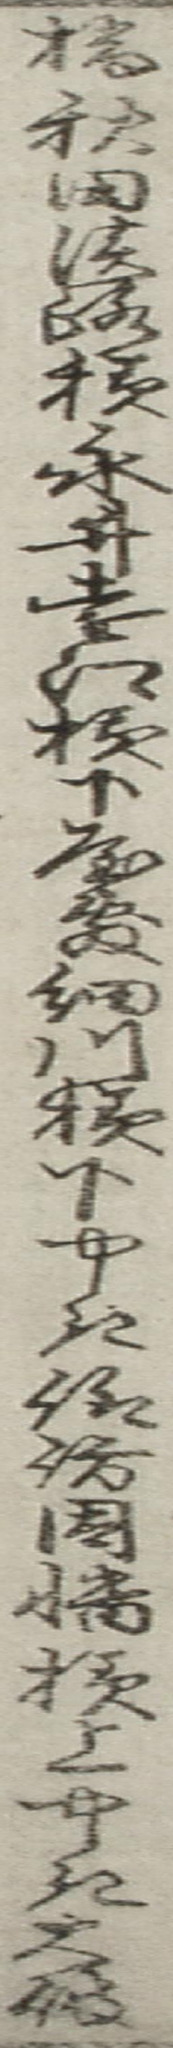橋秋田淡路様永井遠江様下屋敷細川様下やしき諏訪因幡様上やしき大破
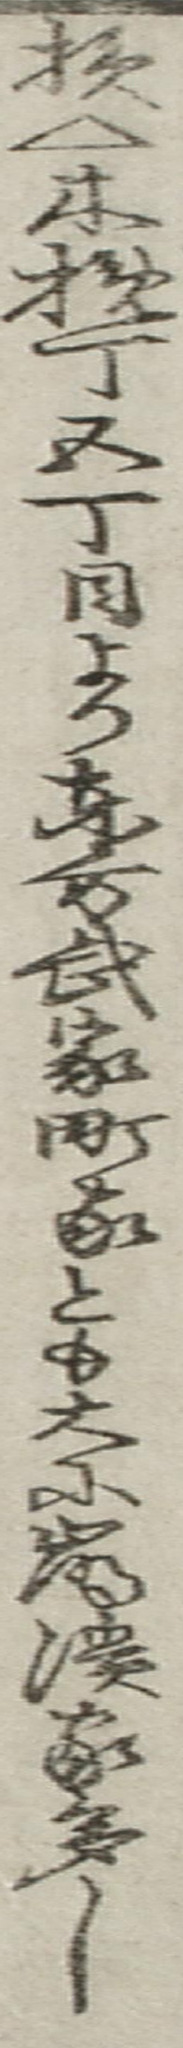損△木挽丁五丁目より東方武家町家とも大小崩潰家多し
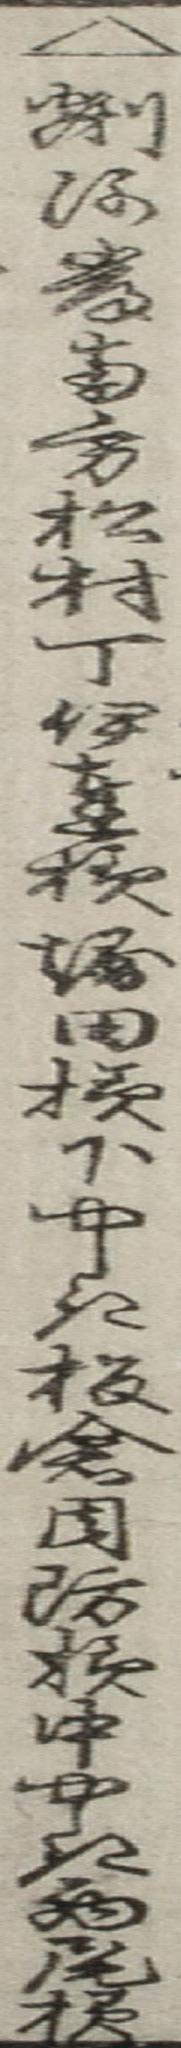△蜊河岸南方松村丁伊達様堀田様下やしき板倉周防様中やしき西尾様
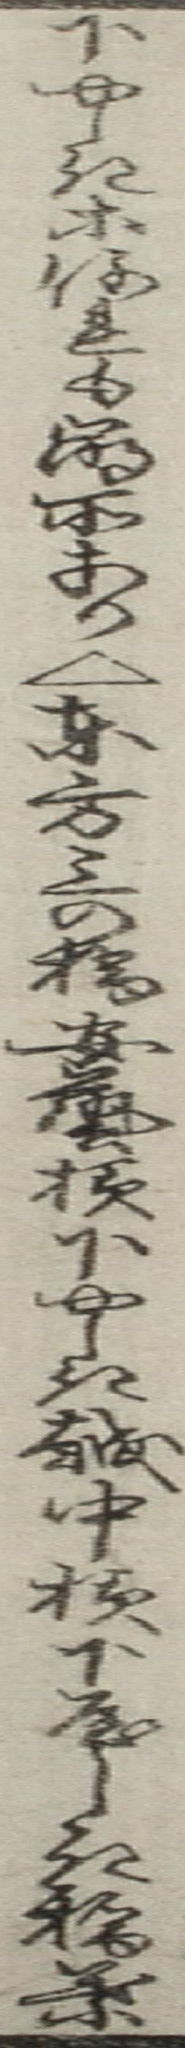下やしき等何れも崩所あり△東方三の橋安芸様下やしき越中様下屋しき稲葉
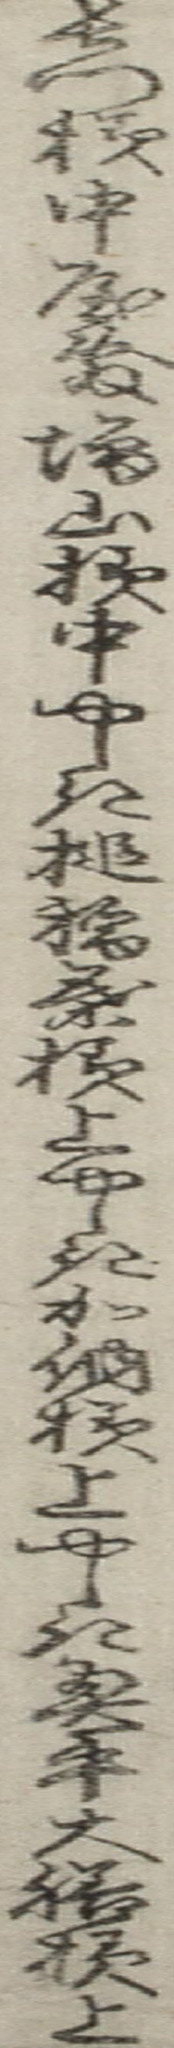長門様中屋敷増山様中やしき槌稲葉様上やしき加納様上やしき奥平大膳様上
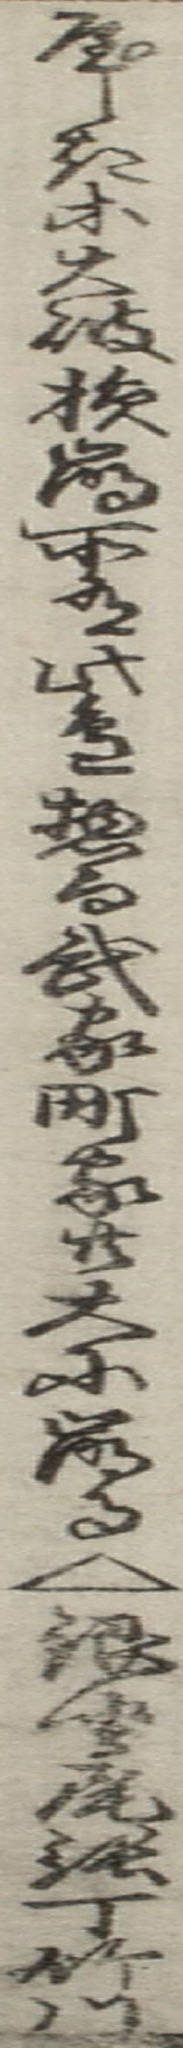屋しき等大破損崩所有此辺惣而武家町家共大小崩る△銀坐尾張丁竹川
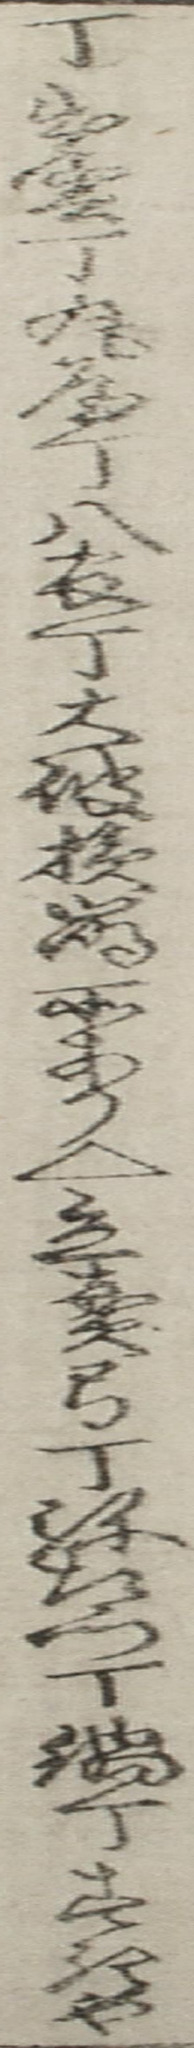丁出雲丁丸屋丁八官丁大破損崩所あり△立売弓丁弥左衛門丁鍋丁すきや
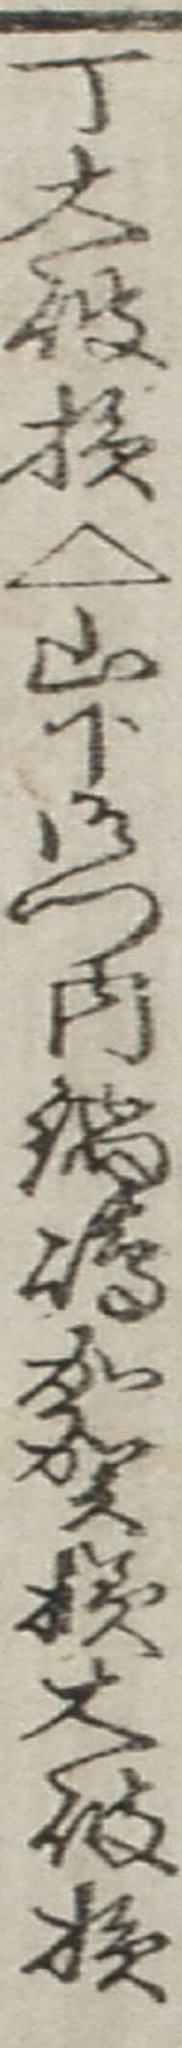丁大破損△山下御門内鍋島加賀様大破損
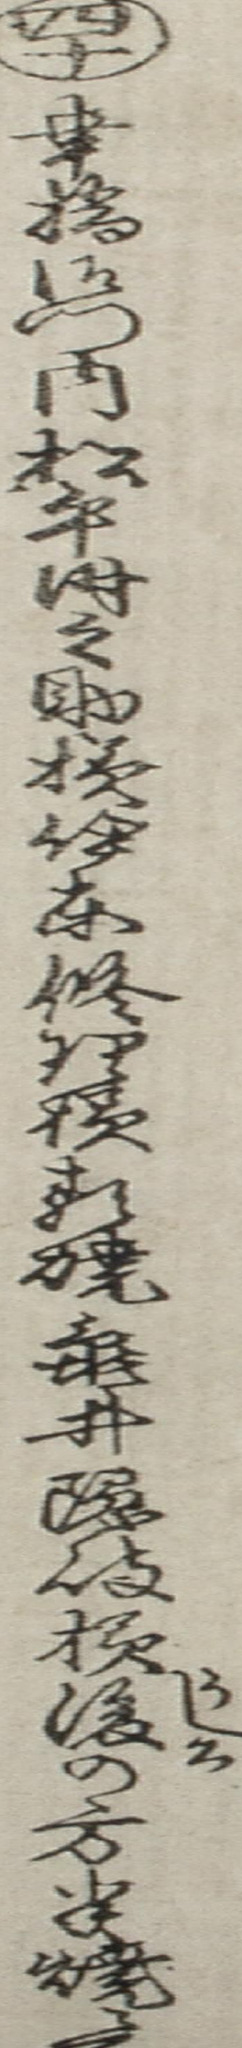幸橋御門内松平時之助様伊東修理様類焼亀井隠岐様後の方半焼にて
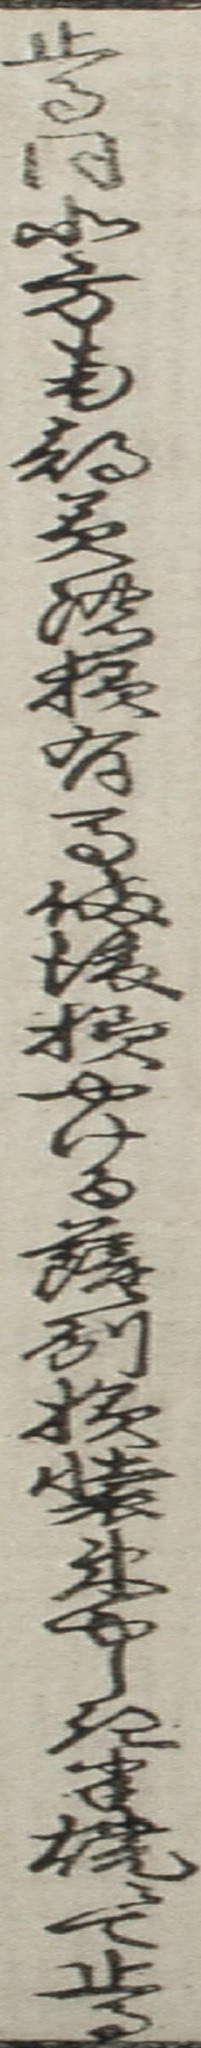止る同北方南部美濃様有馬備後様やける薩州様装束やしき半焼にて止る
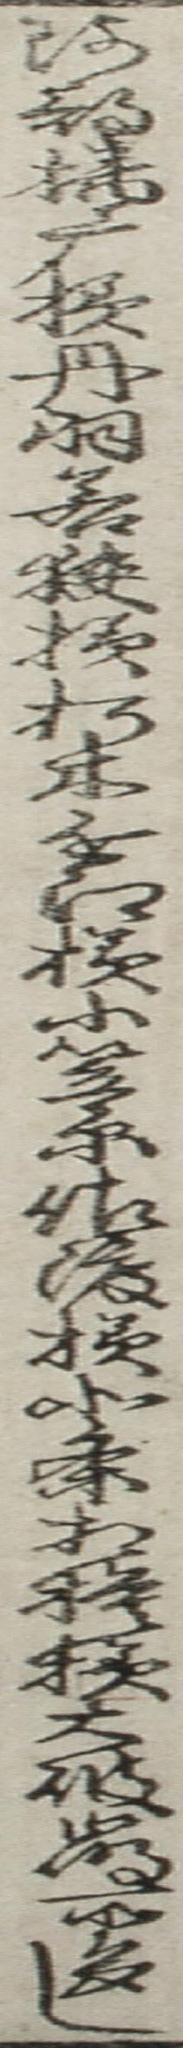阿部播磨様丹羽若狭様朽木遠江様小笠原佐渡様北条相模様大破崩所多し
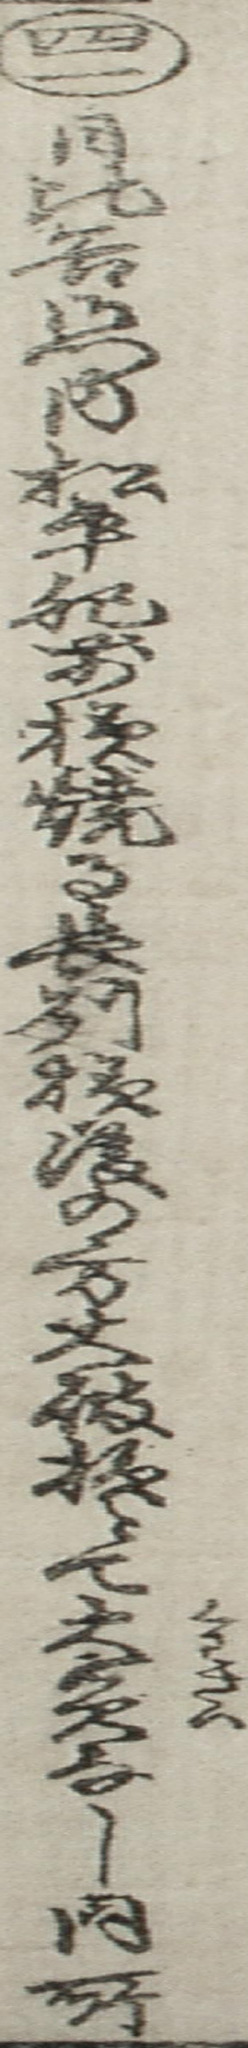日比谷御門内松平肥前様焼る長州様後の方大破損にて火災なし同所
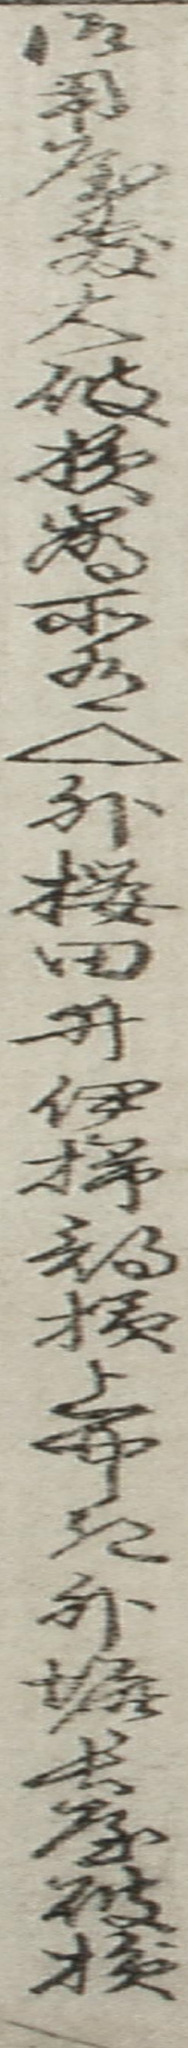御用屋敷大破損崩所有△外桜田井伊掃部様上やしき外塀長屋破損
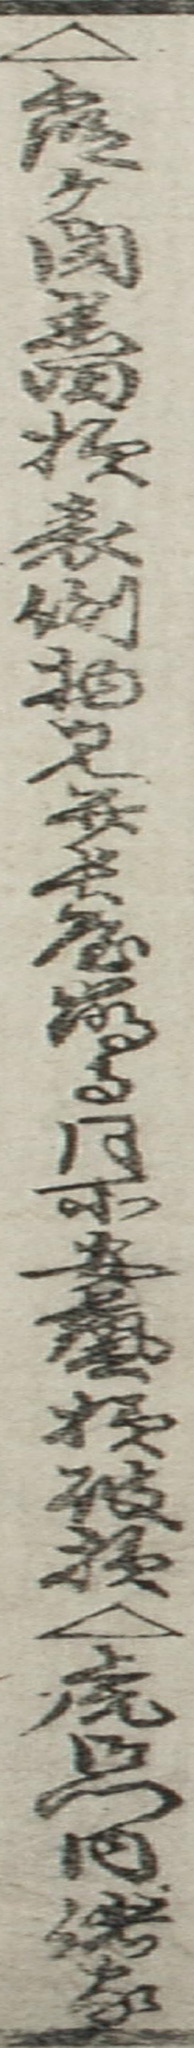△霞ヶ関黒田様表側物見幷長屋崩る同所安芸様破損△虎御門内緒家
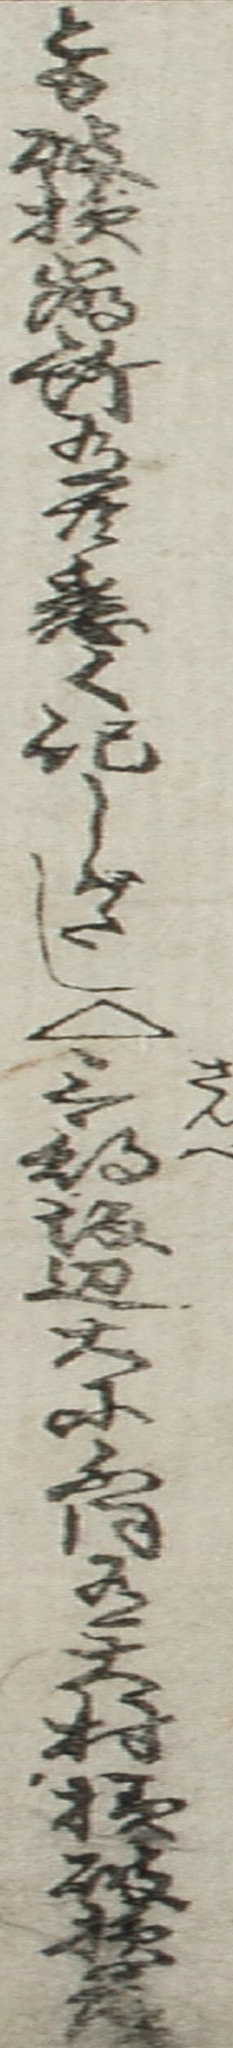とも破損崩所有共悉く記しがたし△三部坂辺大小不同有大村様破損崩る
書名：安政見聞誌　下
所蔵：東京大学地震研究所図書室 Earthquake Research Institute Library, The University of Tokyo, JAPAN
